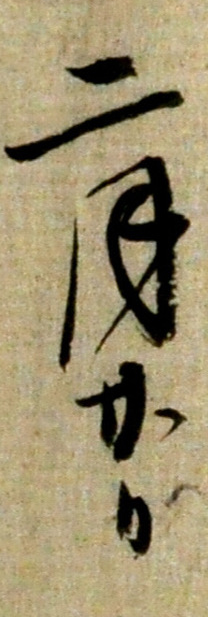二月廿日
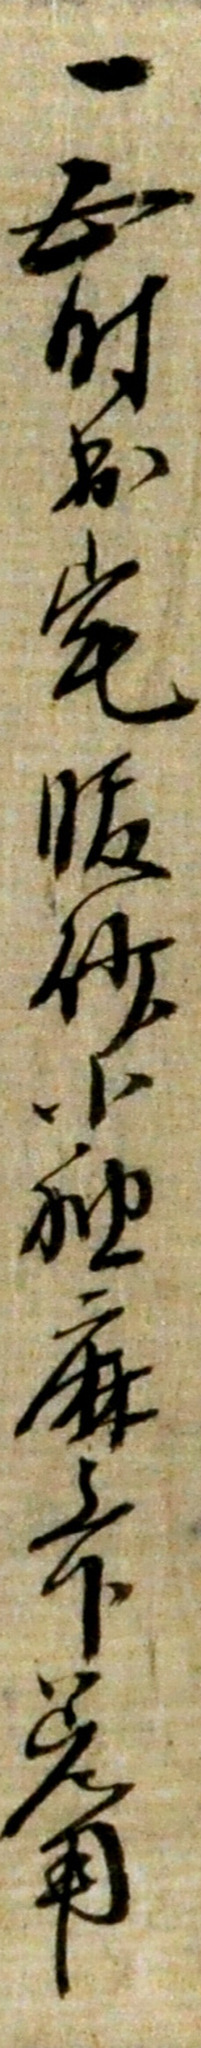一五時出宅服紗小袖麻上下着用
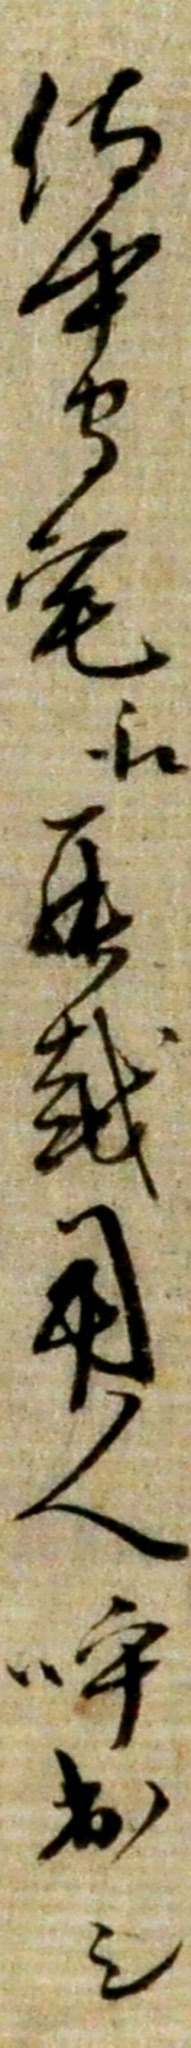備中守宅え罷越用人呼出シ
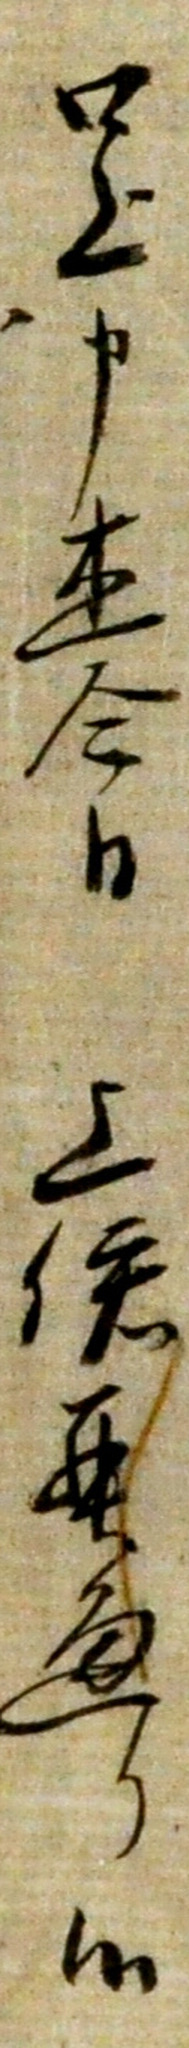口上申述今日上使罷通り候
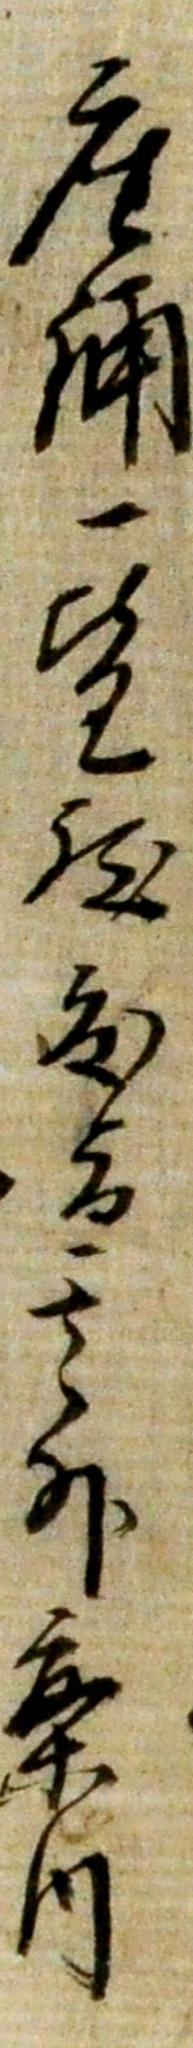座鋪一覧致度旨其外案内
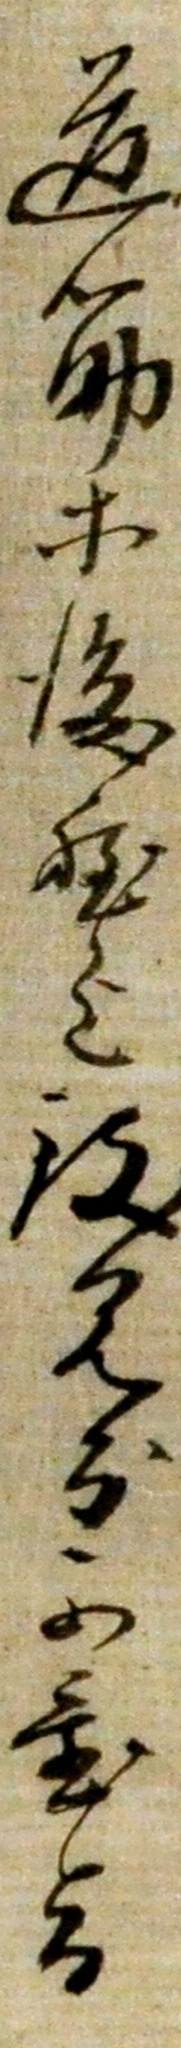道筋等後程迄致見分可置旨
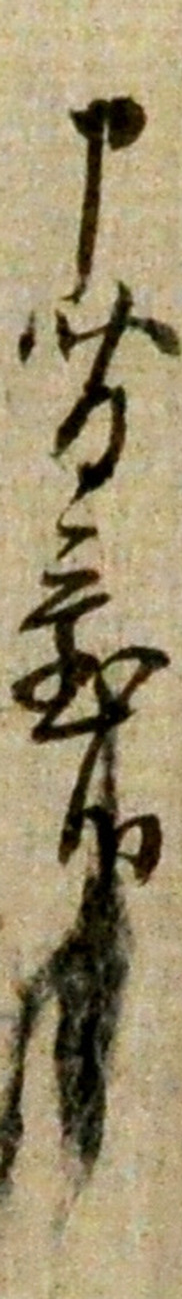申聞置候
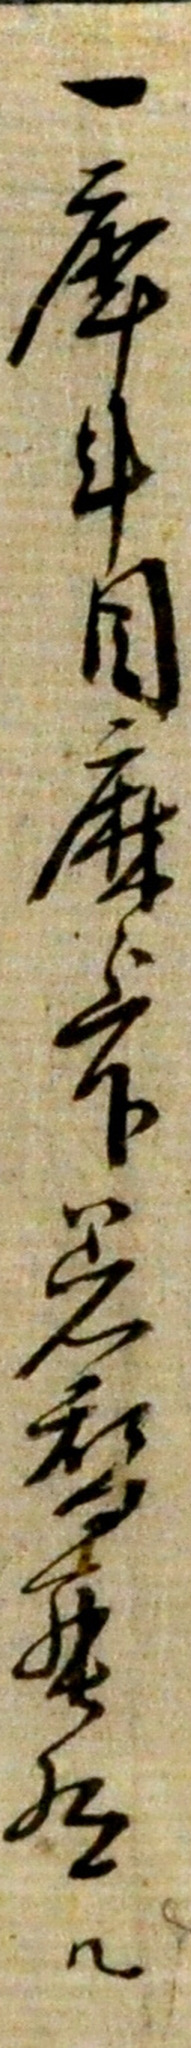一熨斗目麻上下着替罷有候
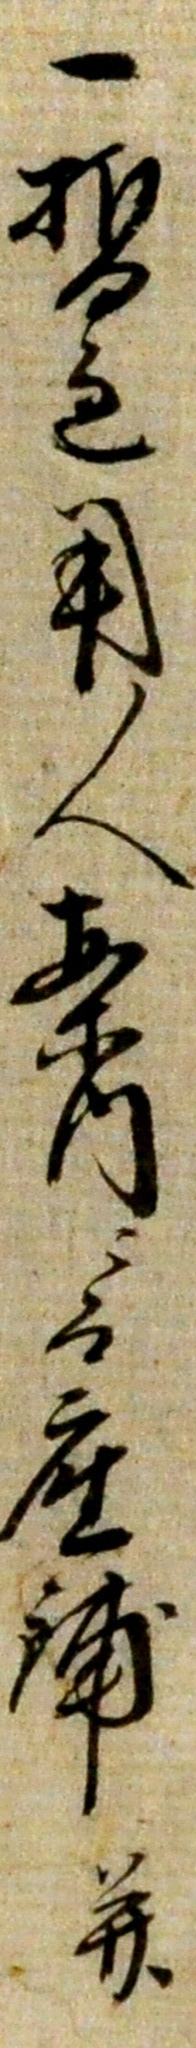一暫過用人案内ニ而座鋪并
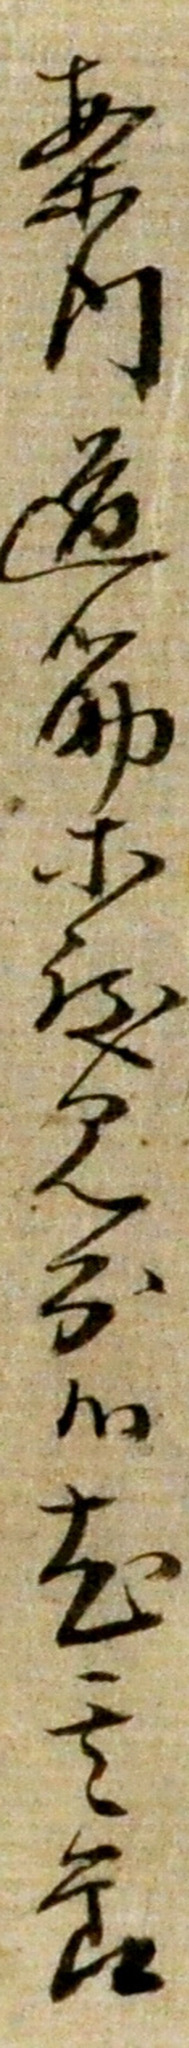案内道筋等致見分候尤其節
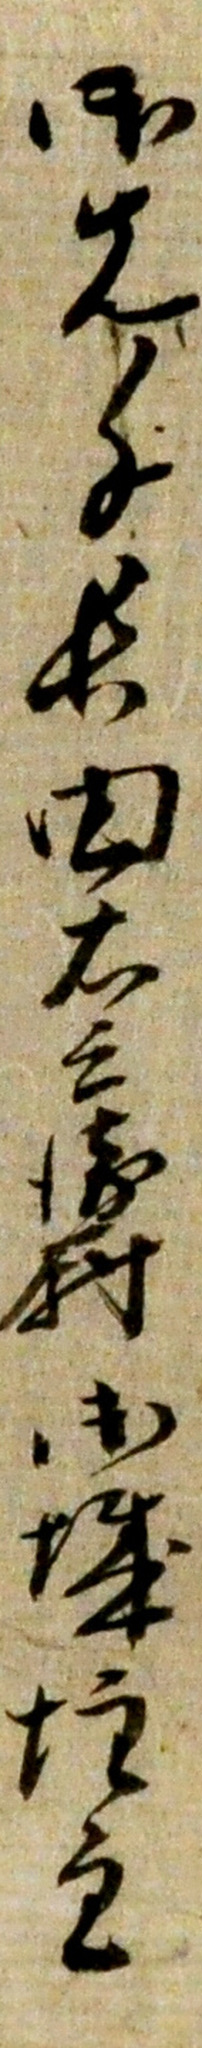御先手長田右兵衛尉御城坊主
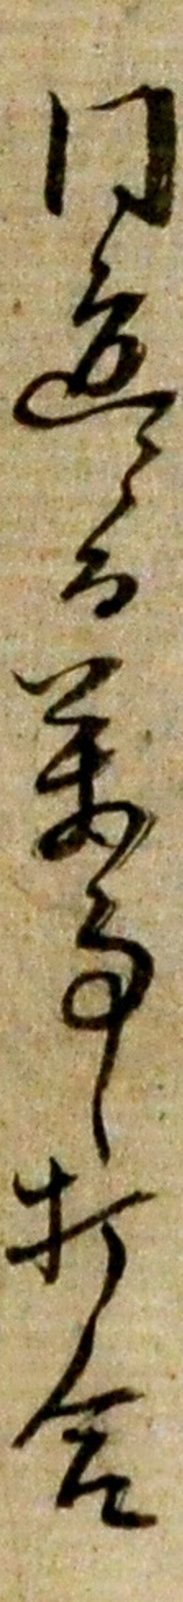同道ニ而万事打合
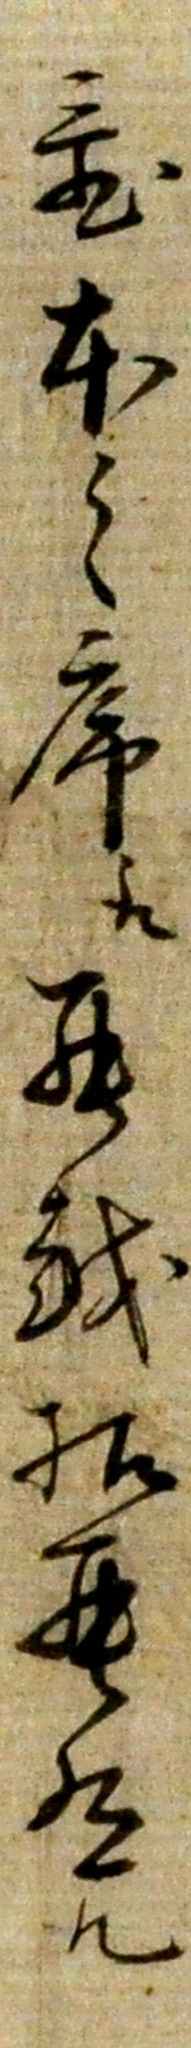置本之席え罷越様罷有候
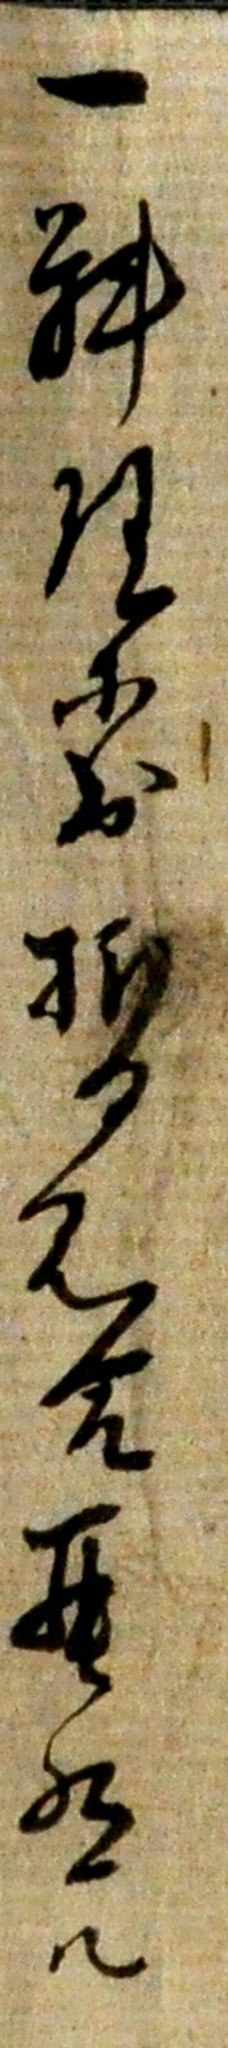一料理等出暫見合罷有候
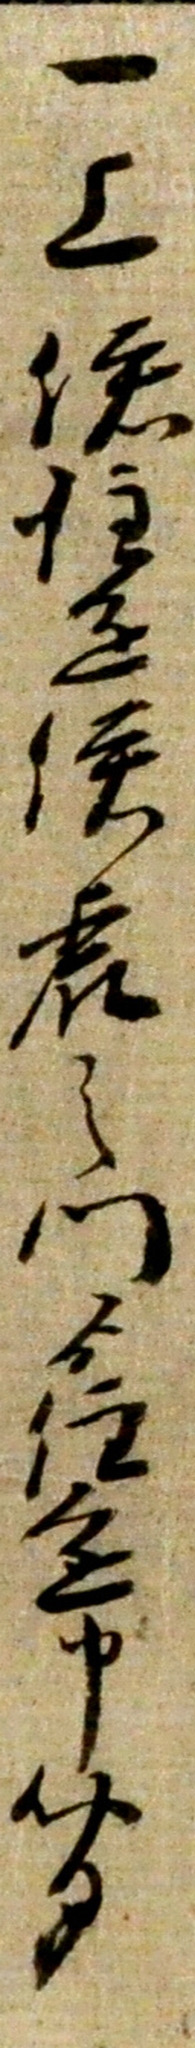一上使注進使虎之門ゟ注進申聞
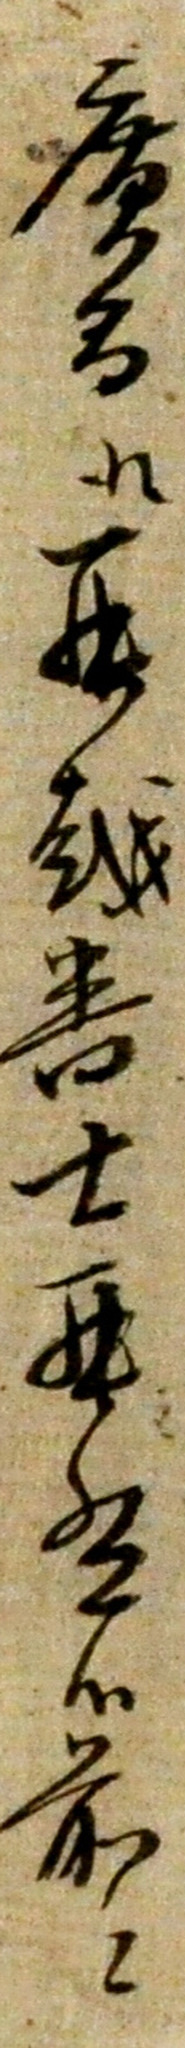広間え罷越番士罷有候前ニ
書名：上使仰付ラレ候節ノ留外
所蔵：伊那市立高遠町図書館・合同会社AMANE
